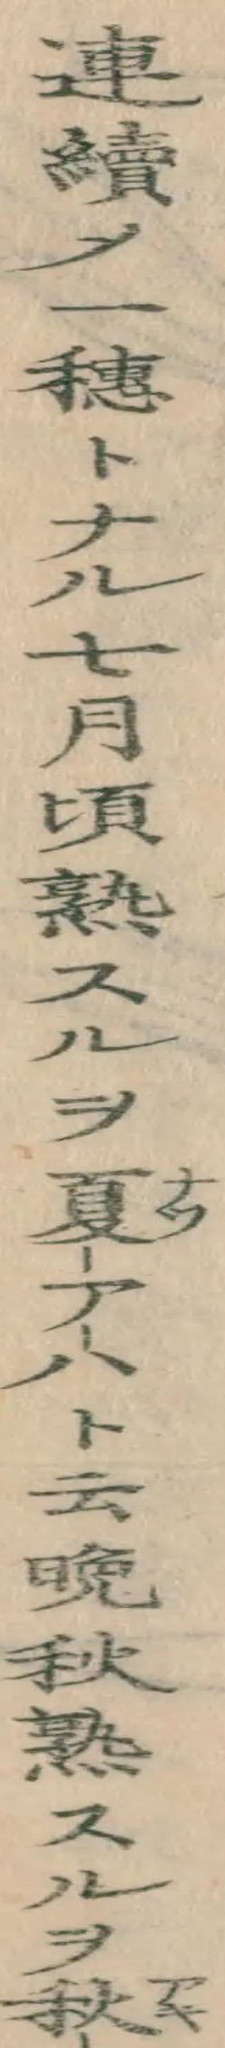連続シテ一穂トナル七月頃熟スルヲ夏-ア-ハト云晩秋熟スルヲ秋-
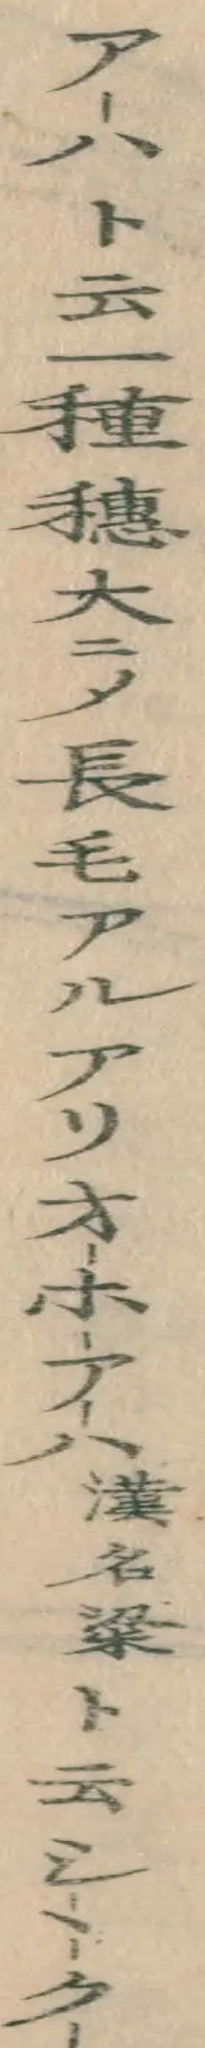ア-ハト云一種穂大ニシテ長毛アルアリオ-ホ-ア-ハ漢名粱ト云シ-ヽ-ク-
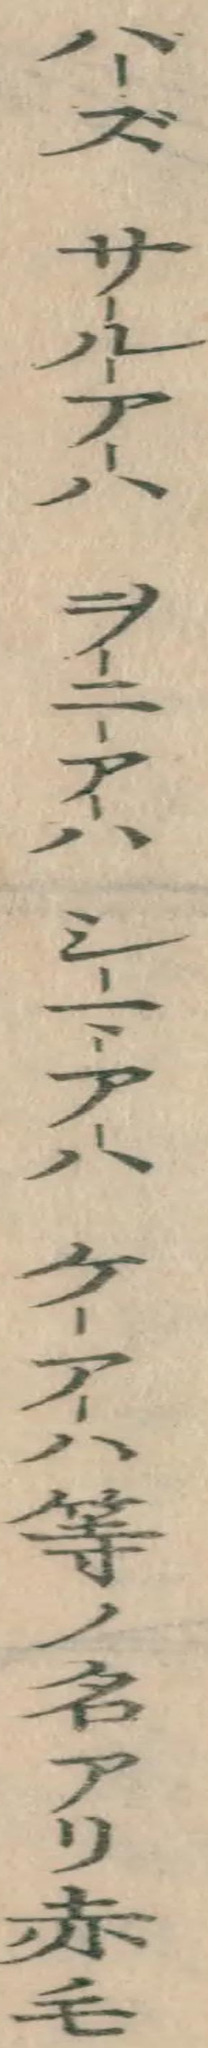ハ-ズサ-ル-ア-ハヲ-ニ-ア-ハシ-マ-ア-ハケ-ア-ハ等ノ名アリ赤毛
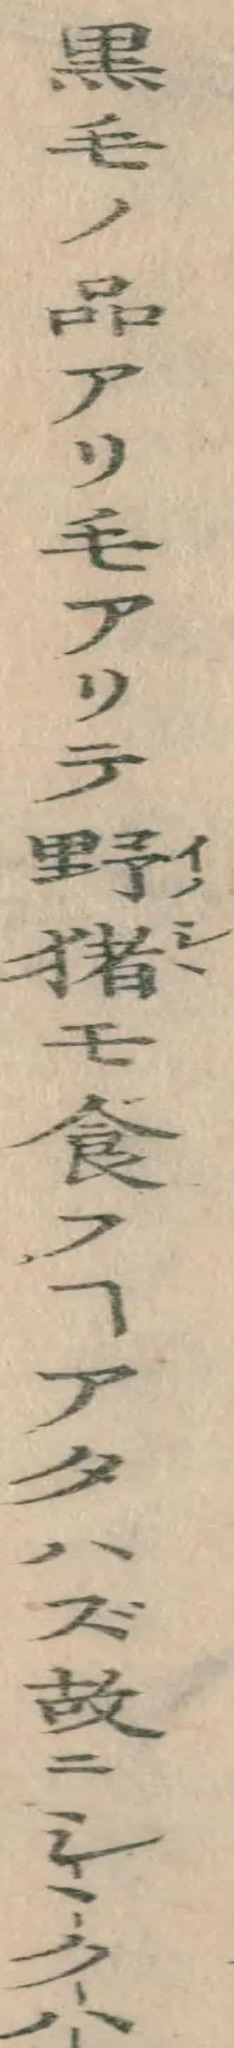黒毛ノ品アリ毛アリテ野猪モ食フコトアタハズ故ニシ-ヽ-ク-ハ-
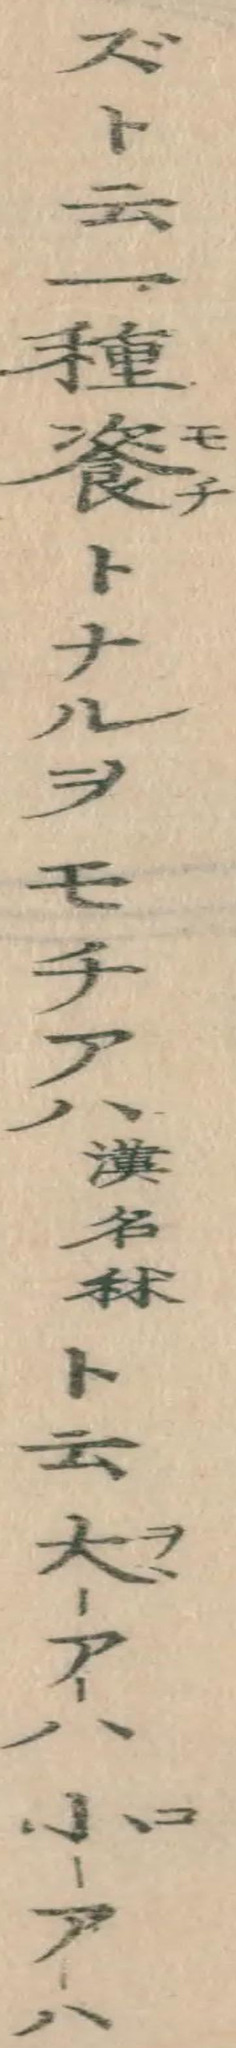ズト云一種餈トナルヲモチアハ漢名秫ト云大-ア-ハ小-ア-ハ
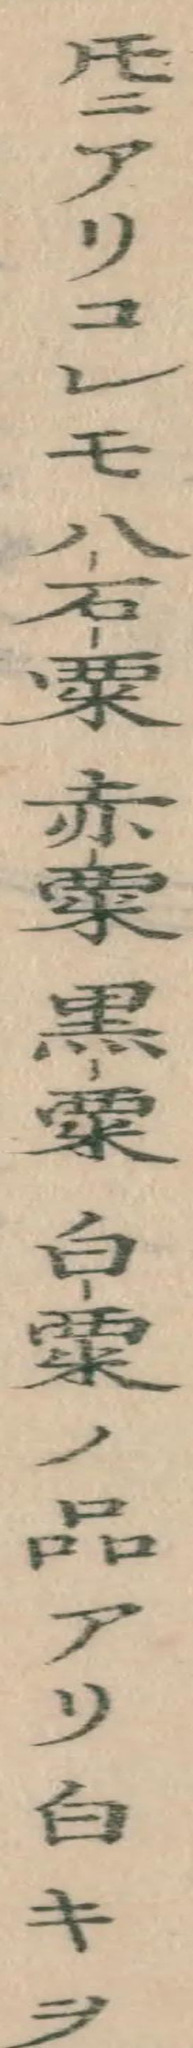トモニアリコレモ八-石-粟赤-粟黒-粟白-粟ノ品アリ白キヲ
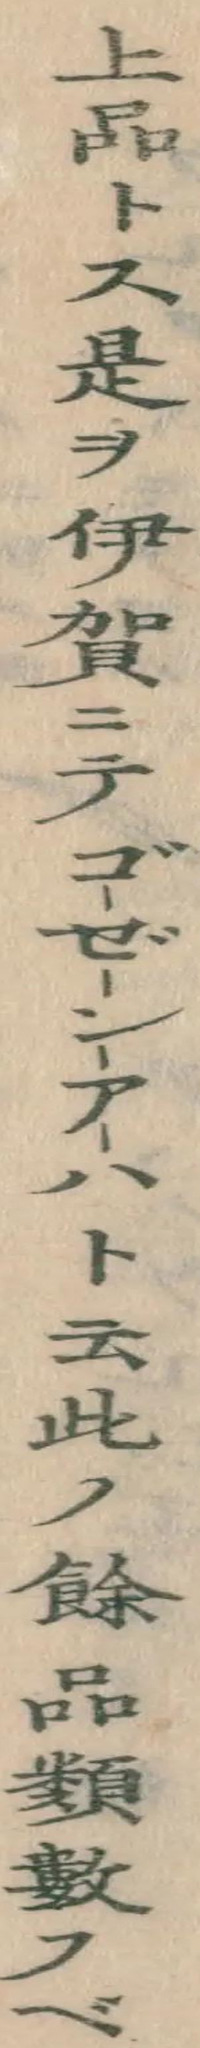上品トス是ヲ伊賀ニテゴ-ゼ-ン-ア-ハト云此ノ余品類数フベ
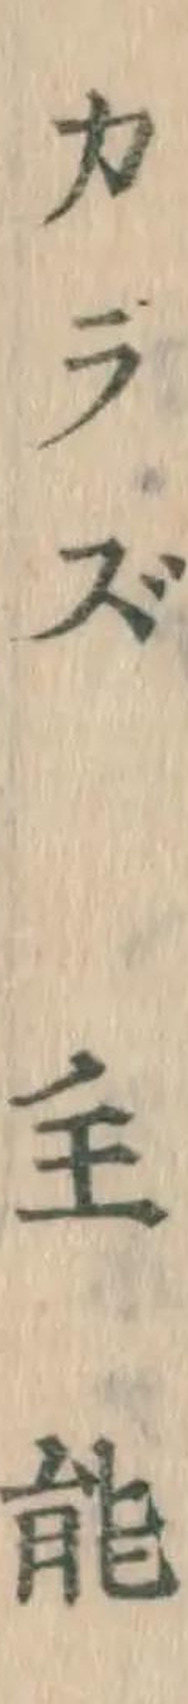カラズ主能
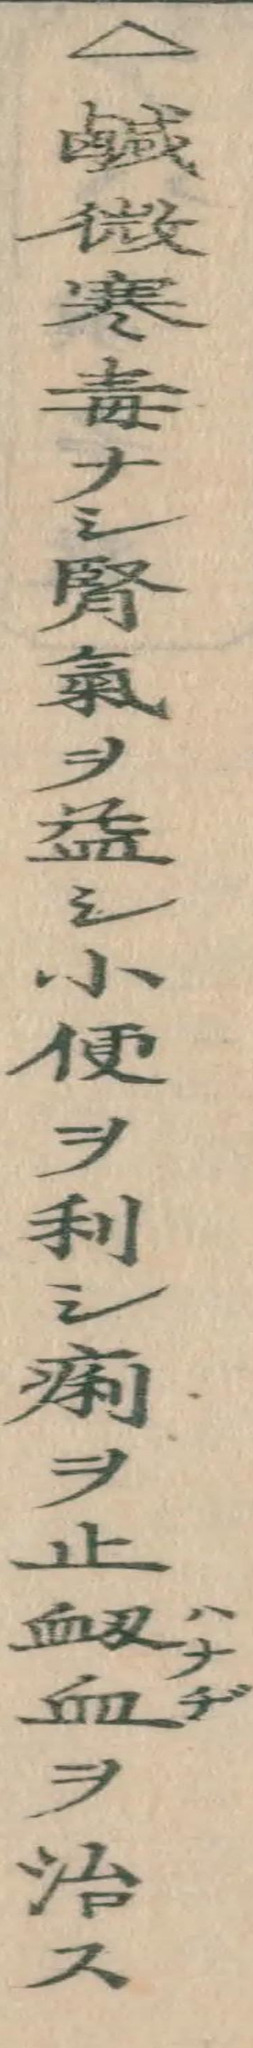△鹹微寒毒ナシ腎気ヲ益シ小便ヲ利シ痢ヲ止衄血ヲ治ス
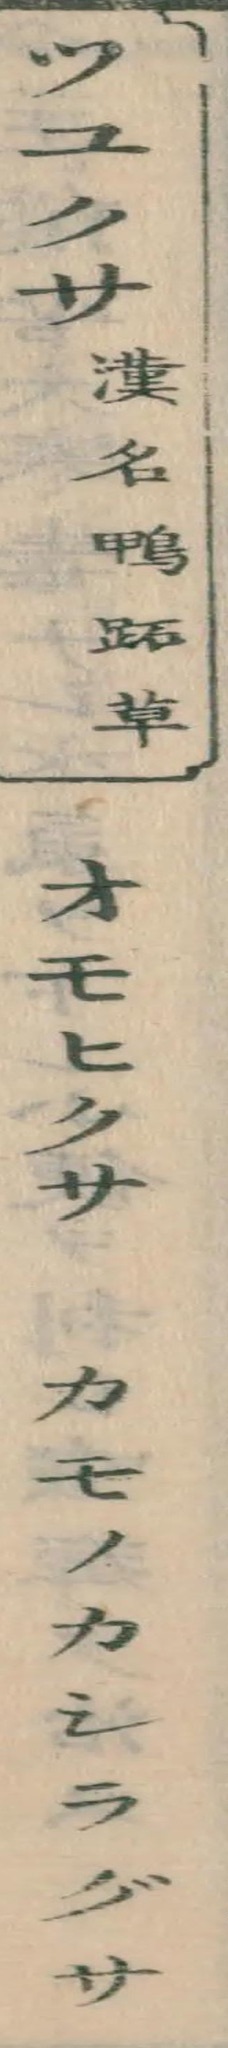[ツユクサ漢名鴨跖草]オモヒクサカモノカシラグサ
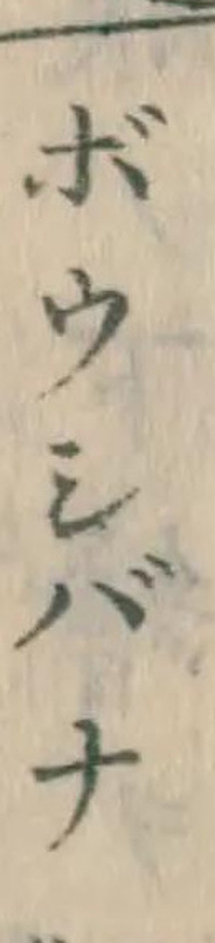ウツシバナ
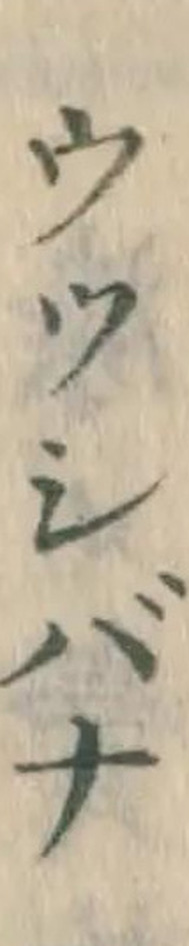ウツシバナ

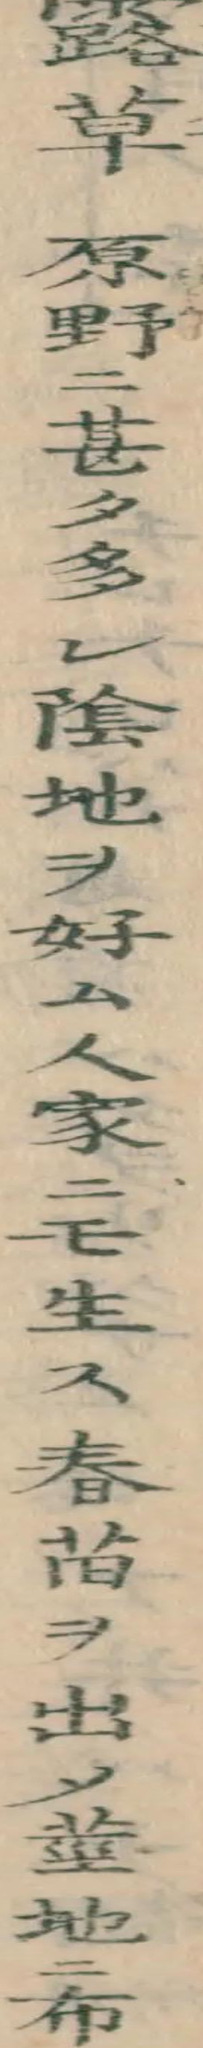露草原野ニ甚タ多ン陰地ヲ好ム人家ニモ生ス春苗ヲ出シテ茎地ニ布
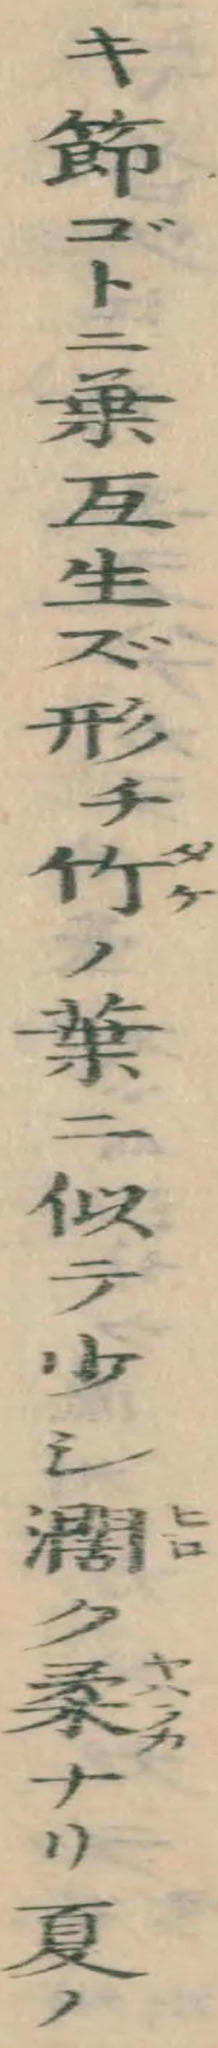キ節ゴトニ葉互生ズ形チ竹ノ葉ニ似テ少シ闊ク柔ナリ夏ノ
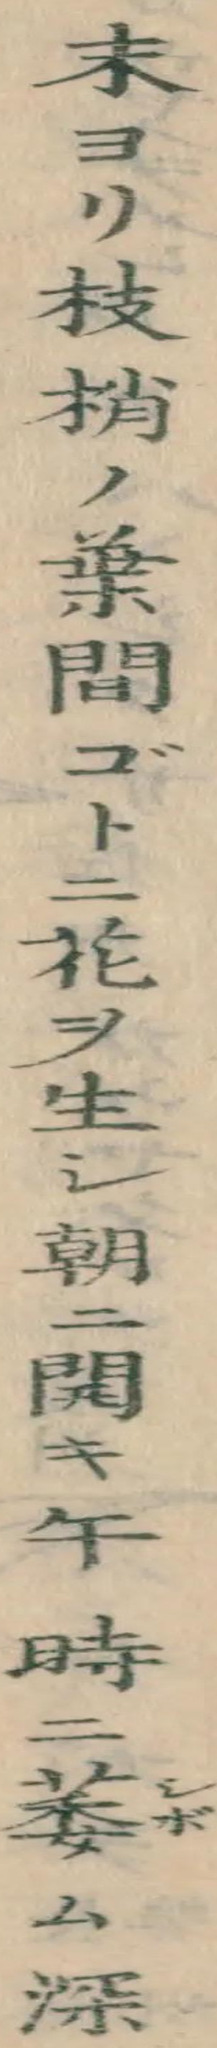末ヨリ枝梢ノ葉間ゴトニ花ヲ生シ朝ニ開キ午時ニ萎ム深
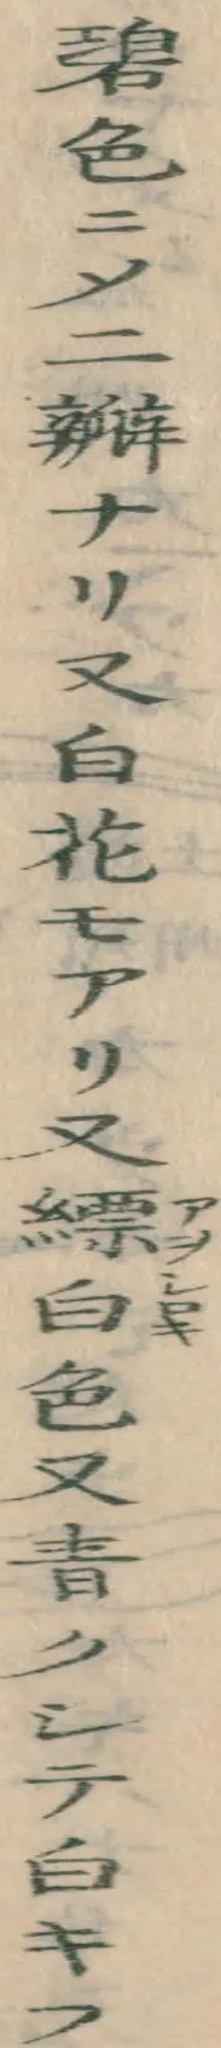碧色ニシテ二弁ナリ又白花モアリ又縹白色又青クシテ白キフ
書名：これこれ草 2巻. [2]
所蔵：国立国会図書館 National Diet Library, JAPAN
